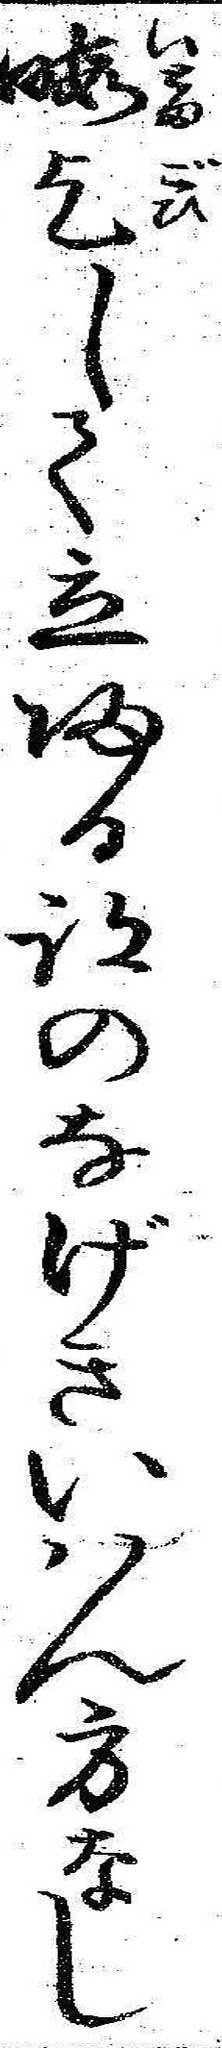暇乞して立帰る跡のなげきいはん方なし
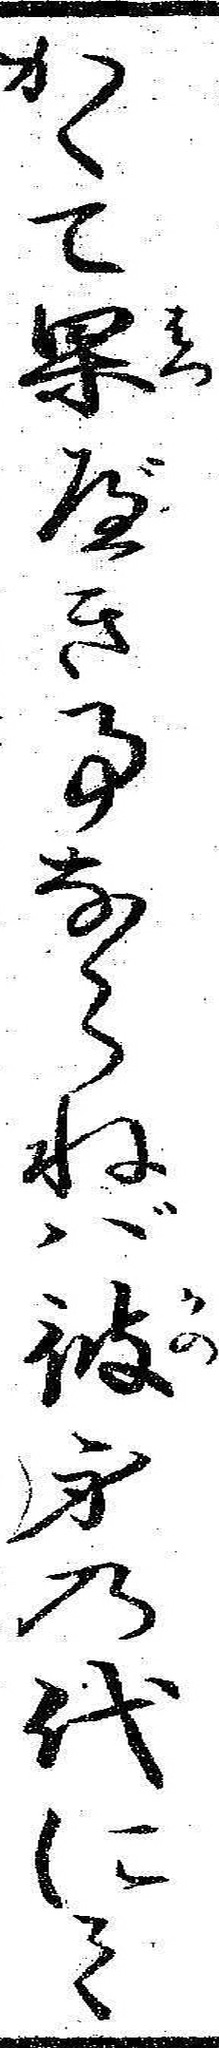かくて果べき事ならねば彼身の代にて
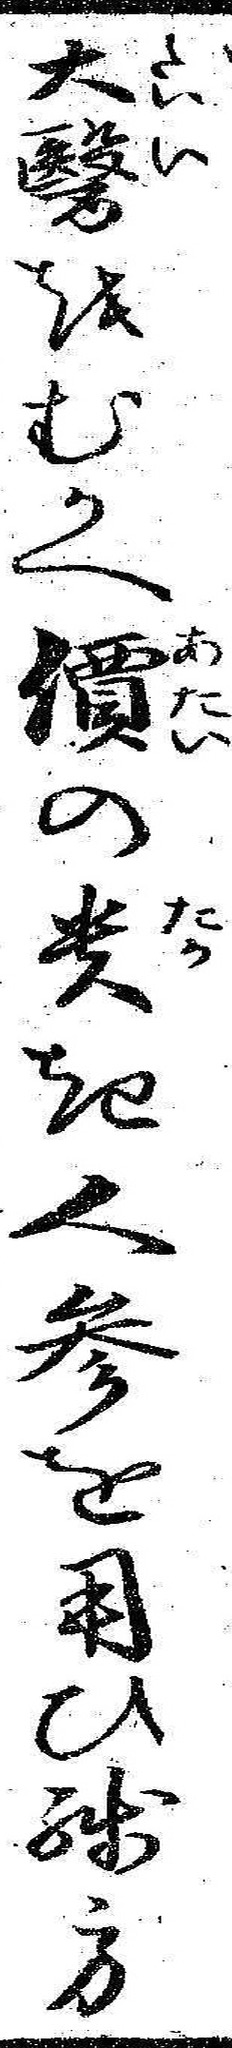大医をむかへ価の貴き人参を用ひ残方
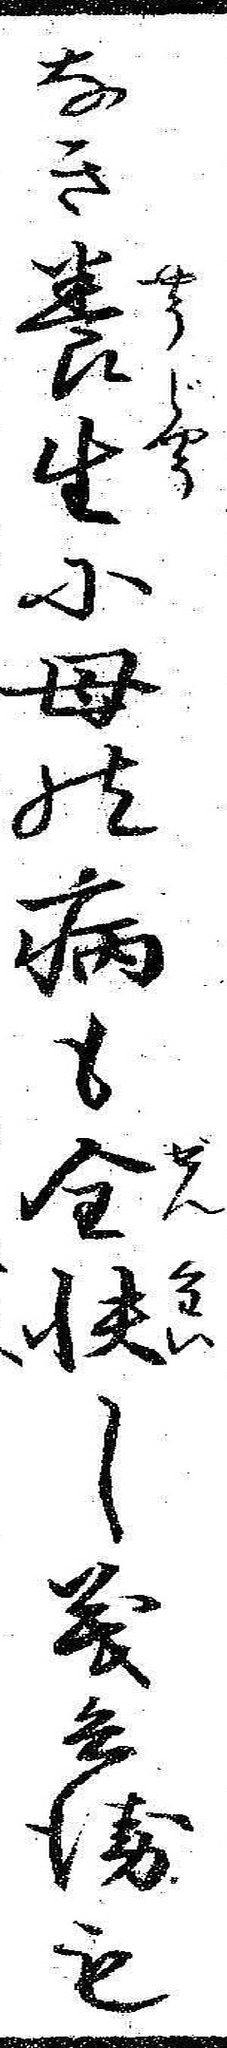なき養生に母の病も全快し義兵衛も
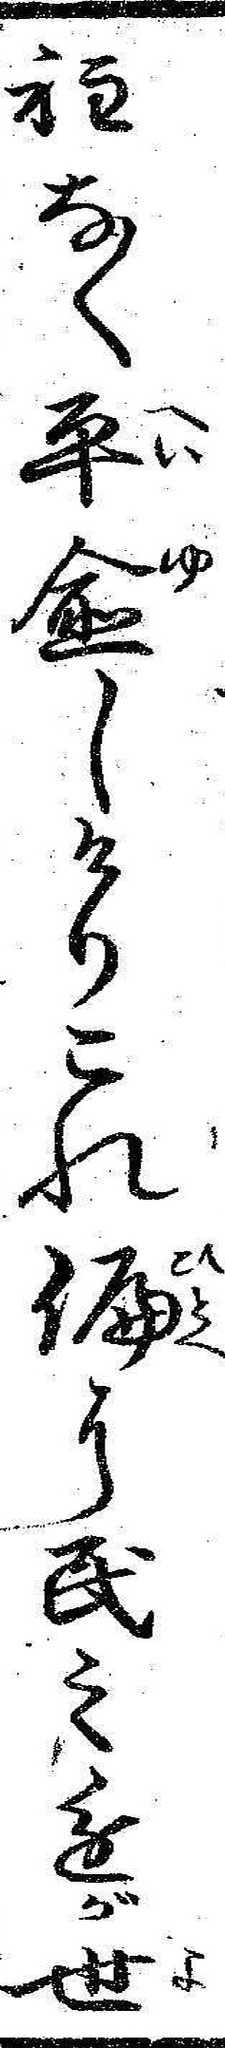程なく平癒しけりこれ偏に民之進が世
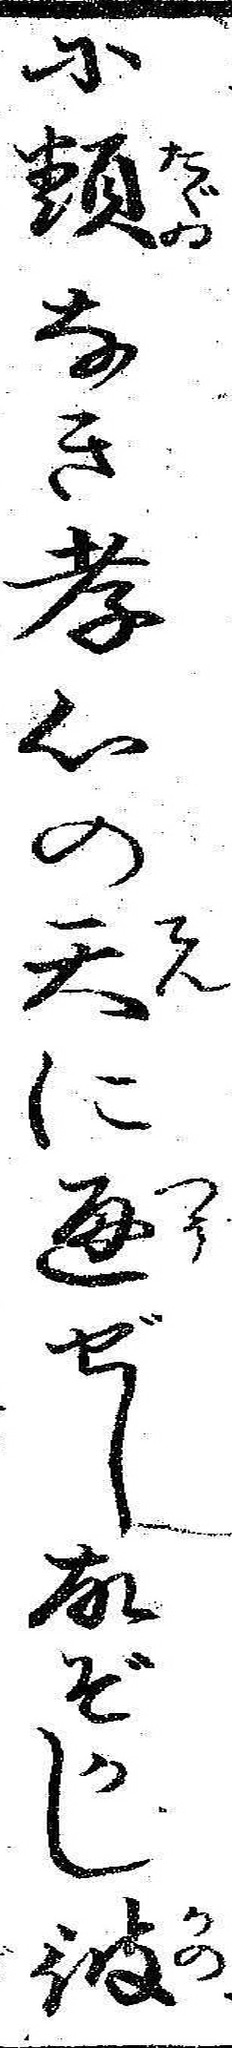に類なき孝心の天に通ぜし故ぞかし彼
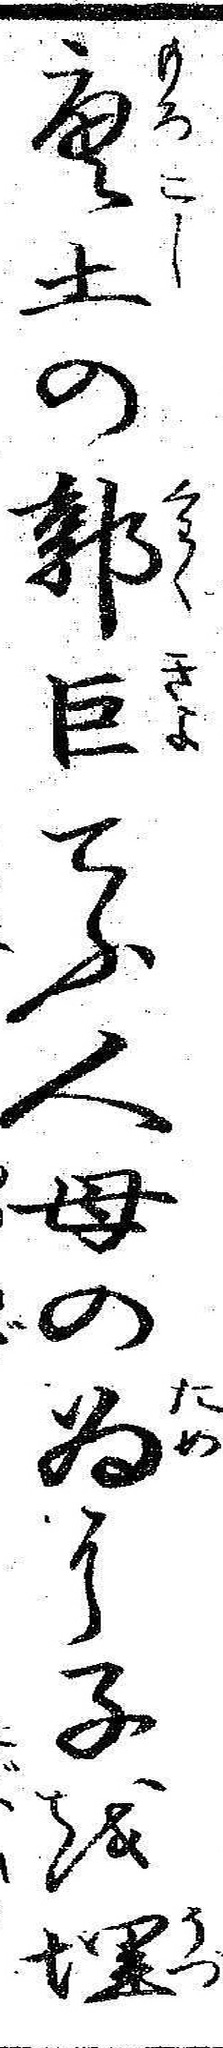唐土の郭巨てふ人母の為に子を埋
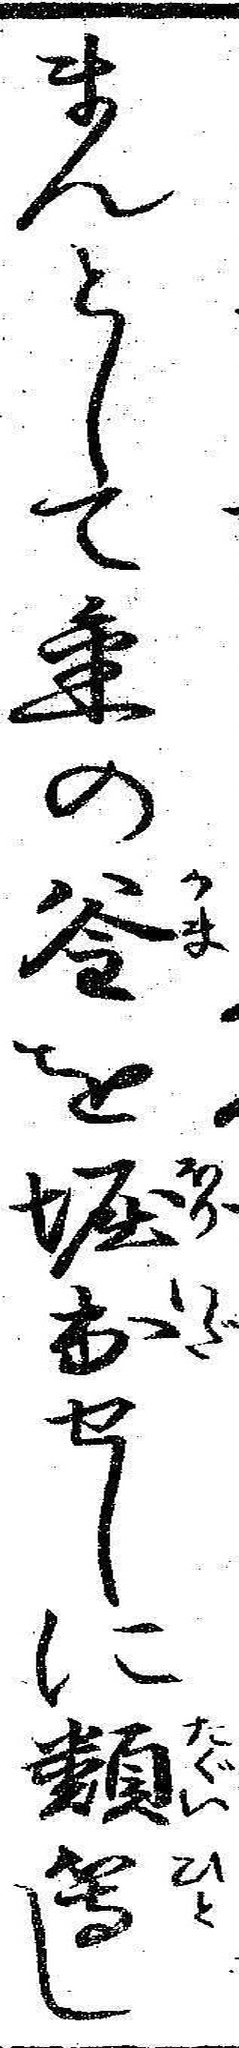まんとして金の釜を堀出せしに類等し
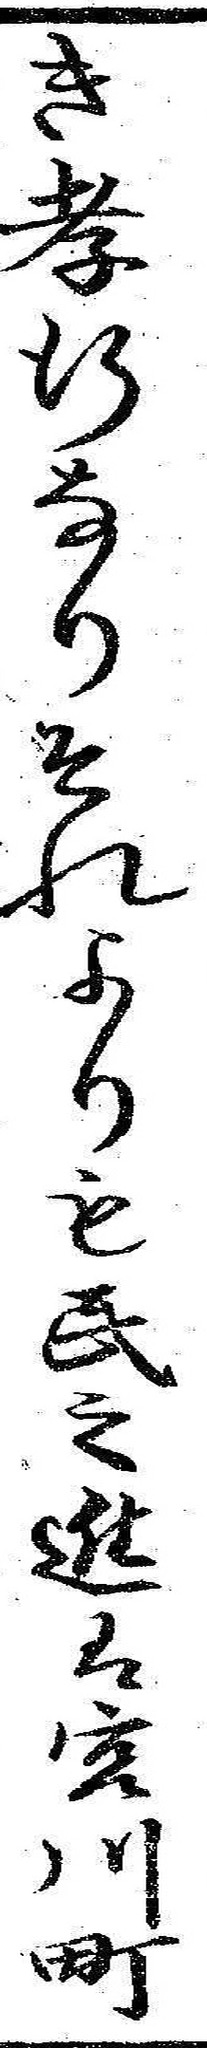き孝行なりそれよりも民之進は宮川町
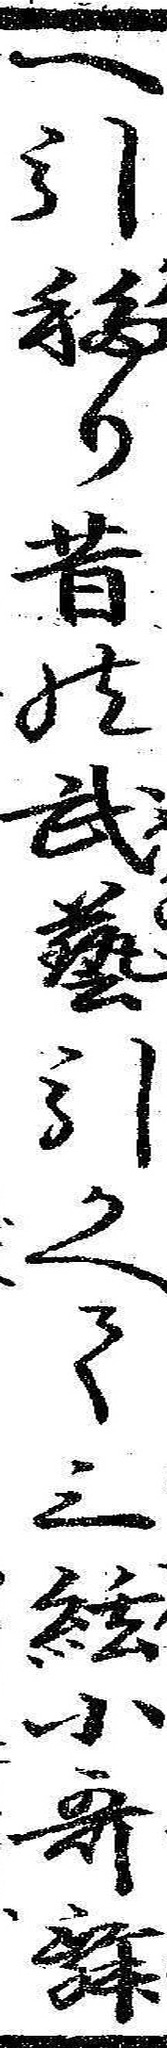へ引移り昔の武芸引かへて三絃小哥舞
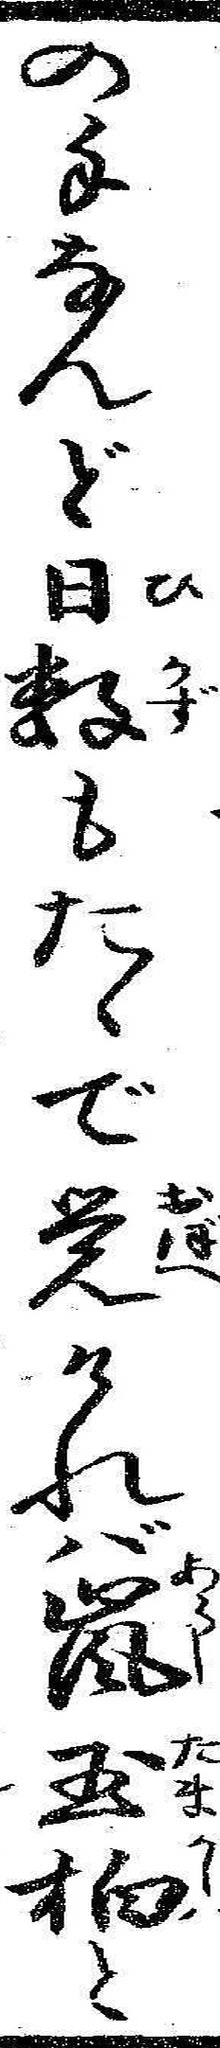の手なんど日数もたゝで覚ければ嵐玉柏と
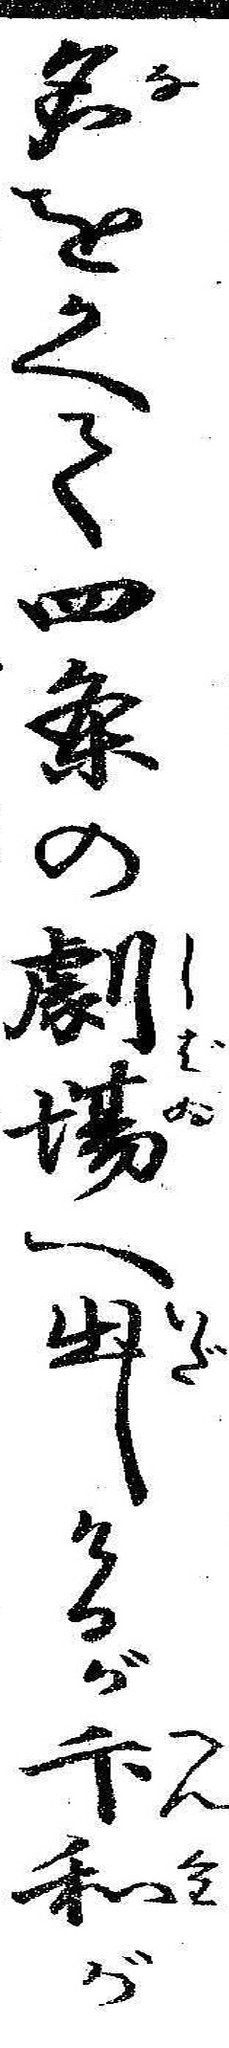名をかへて四条の劇場へ出しけるが卞和が
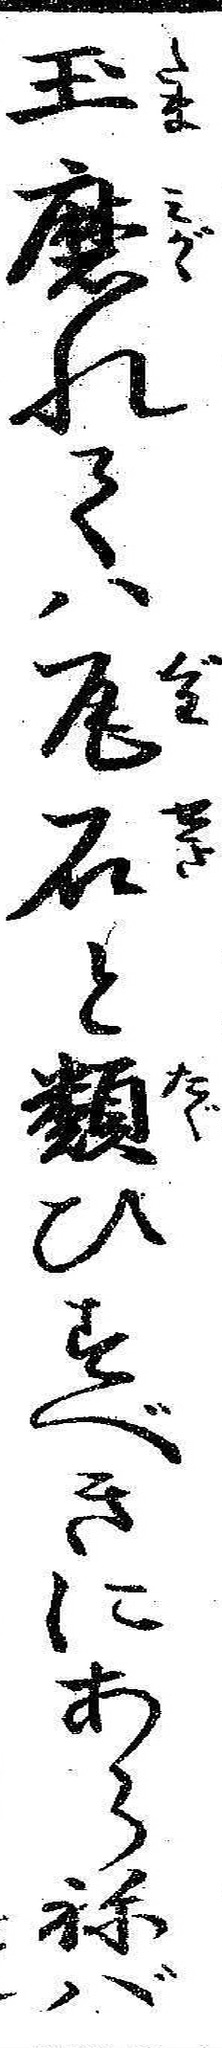玉磨れては瓦石と類ひすべきにあらねば
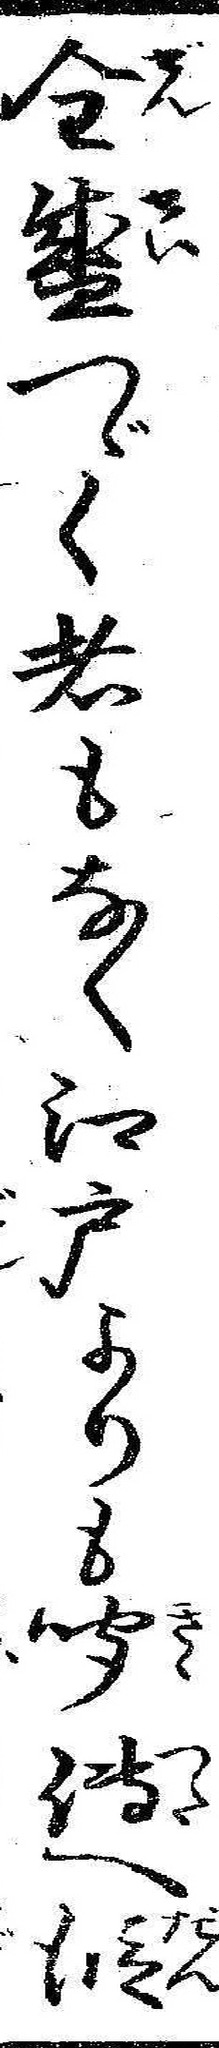全盛つゞく者もなく江戸よりも聞伝へ段
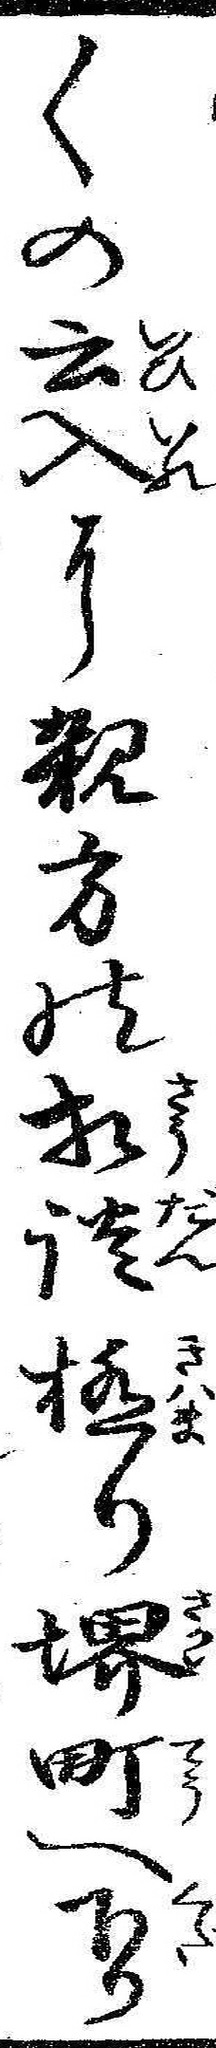〱の云入に親方の相談極り堺町へ下り
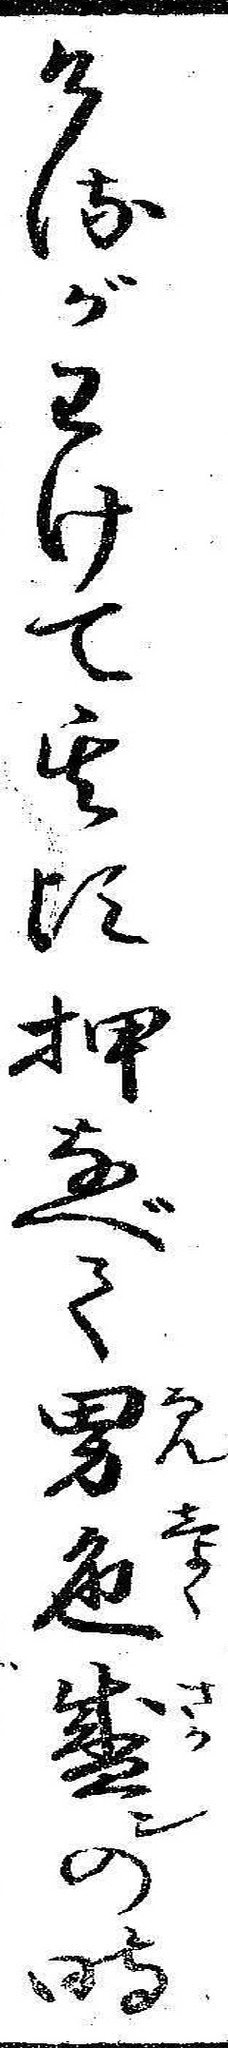けるがわけて其頃押なべて男色盛時
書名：根無草後編
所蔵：国文学研究資料館
